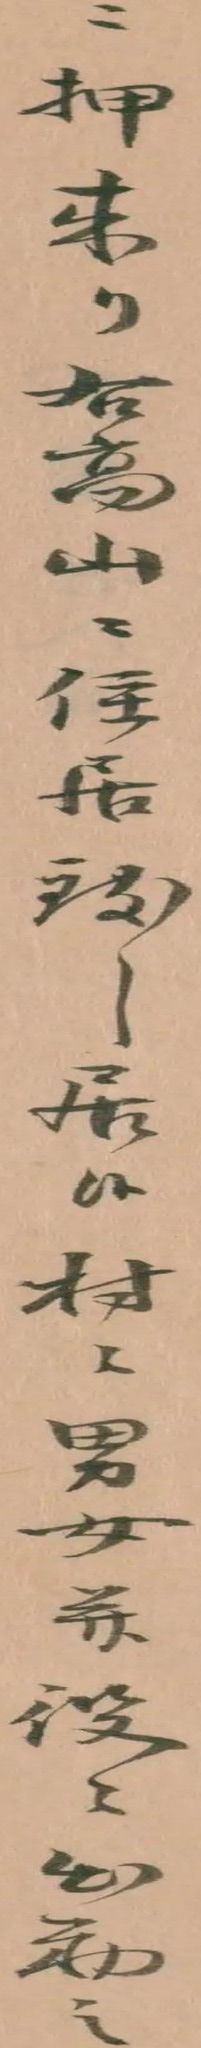二押来り右高山二住居致し居候村々男女并役二役々出勤之
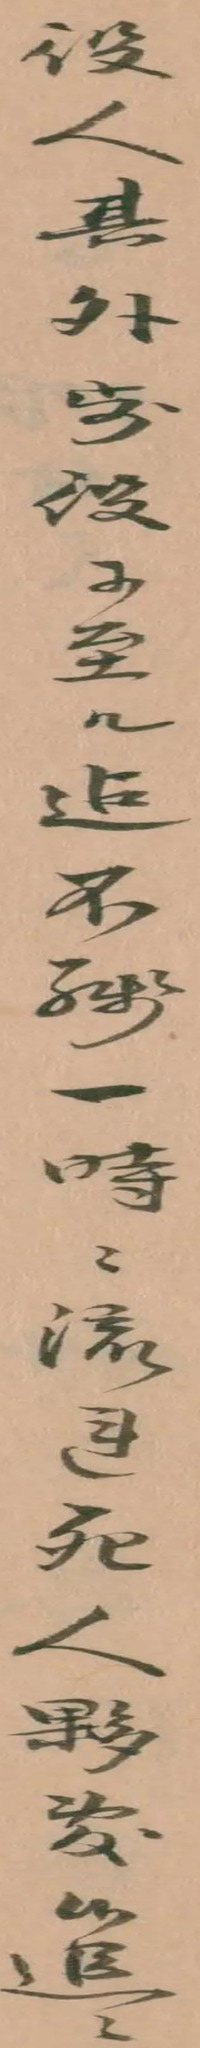役人其外歩役二至ル迄不残一時二流れ死人夥敷候追々
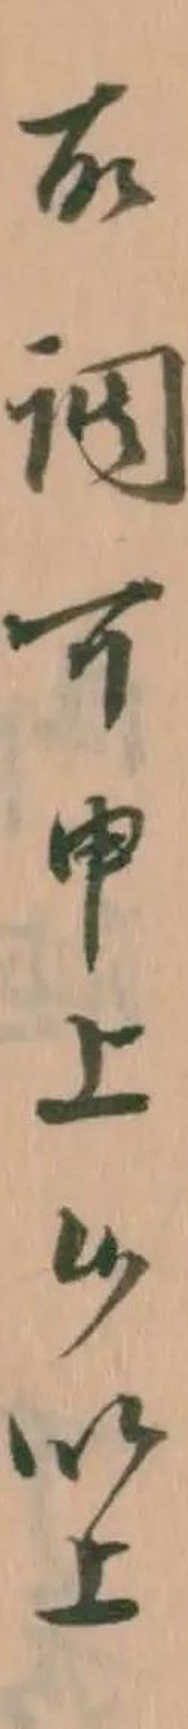取調可申上候以上
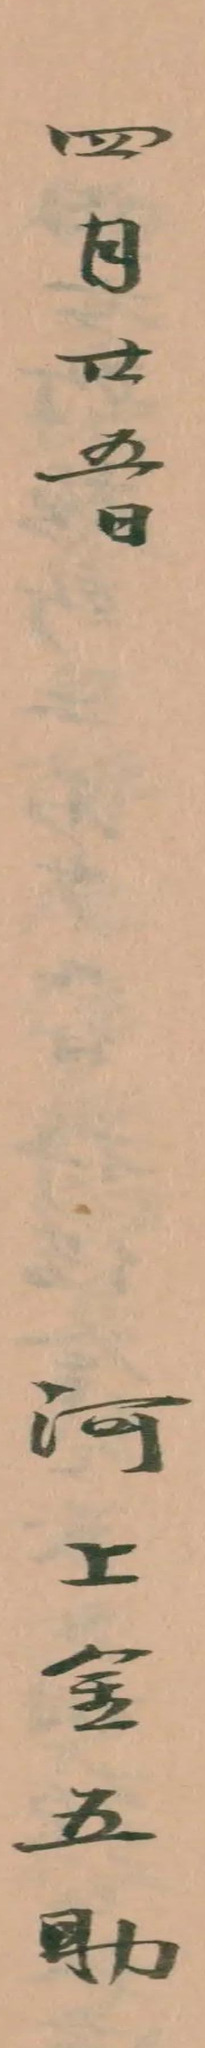四月廿五日川上金吾助
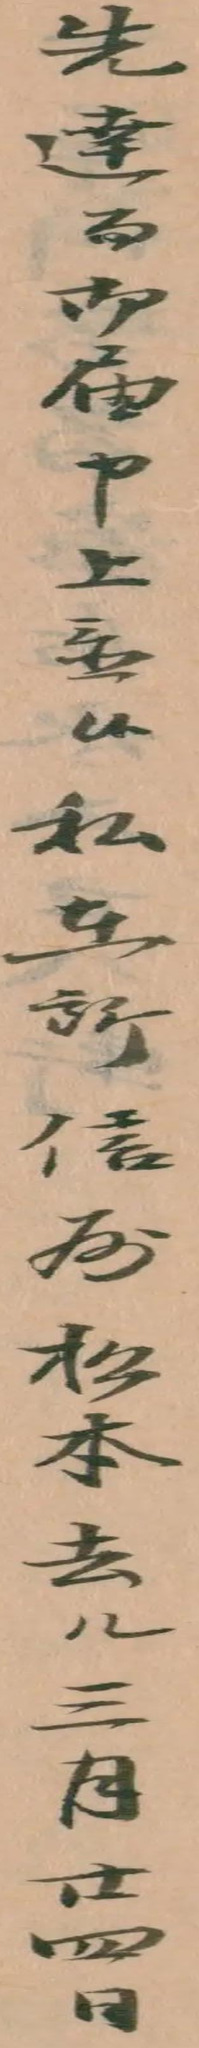先達而御届申上置候私在所信州松本去ル三月廿四日
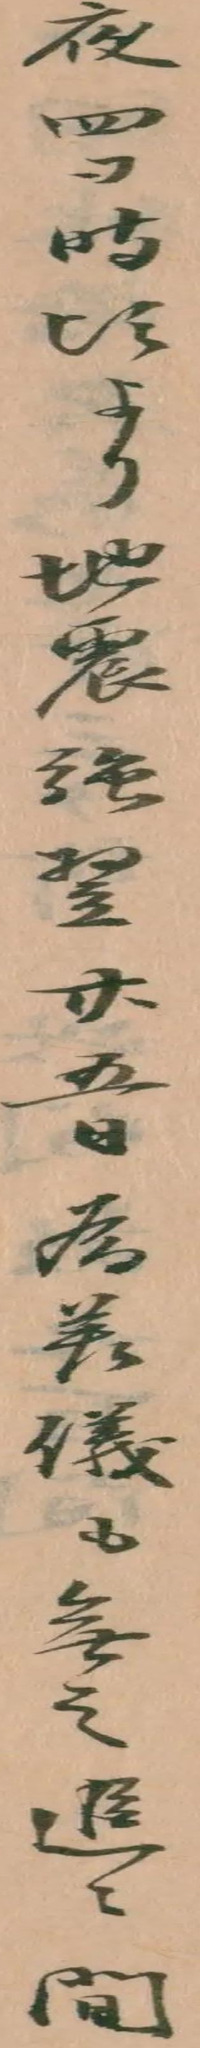夜四ツ時頃より地震強翌廿五日為差儀も無之追々間
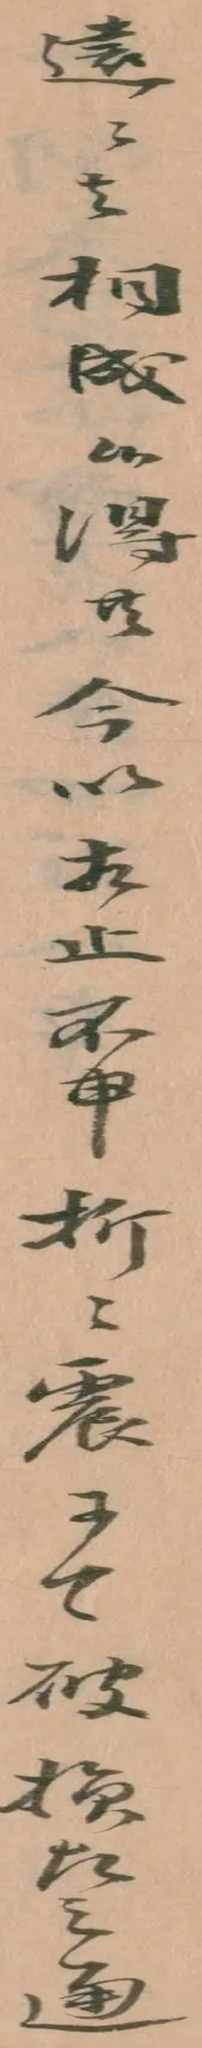遠二者相成候得共今以相止不折々震にて破損左之通
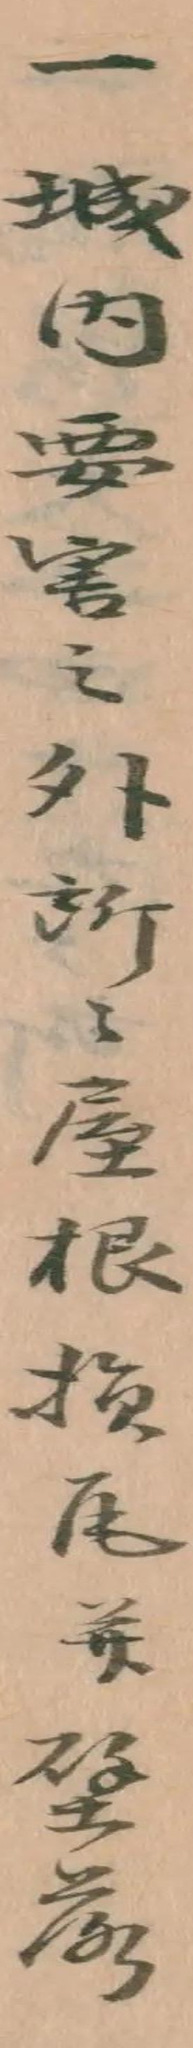一城内要害之外所々屋根損瓦并壁落
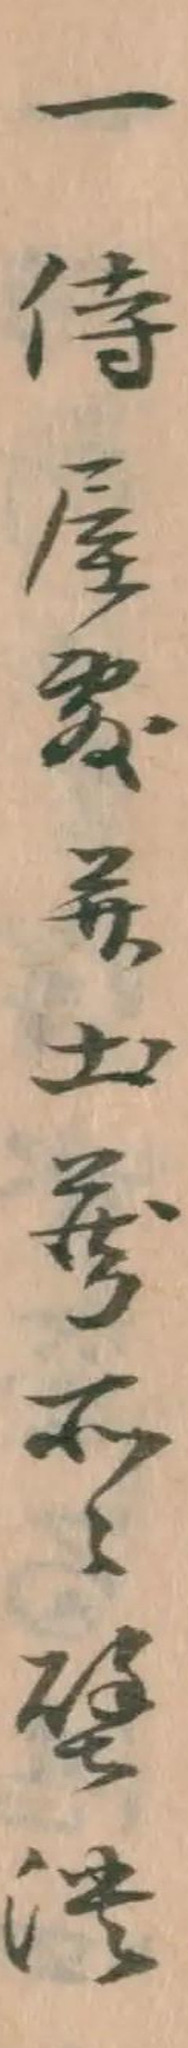一侍屋敷并土蔵所々壁潰
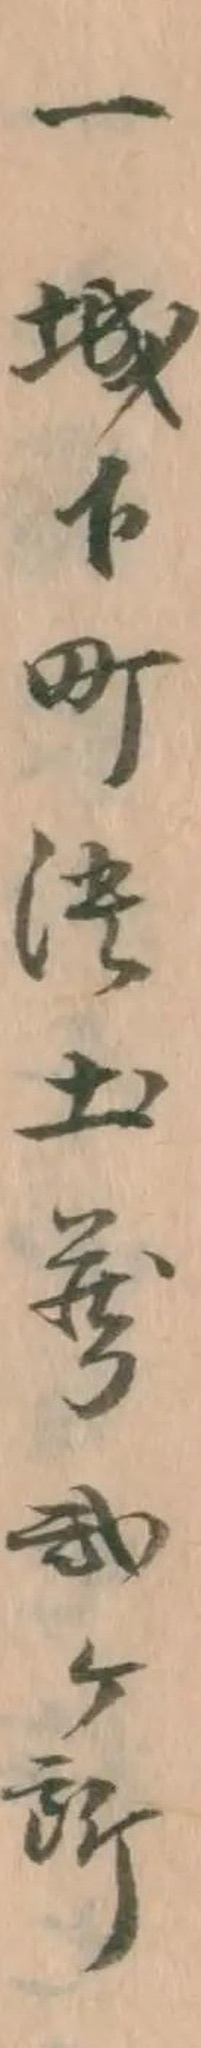一城下町潰土蔵弐ヶ所
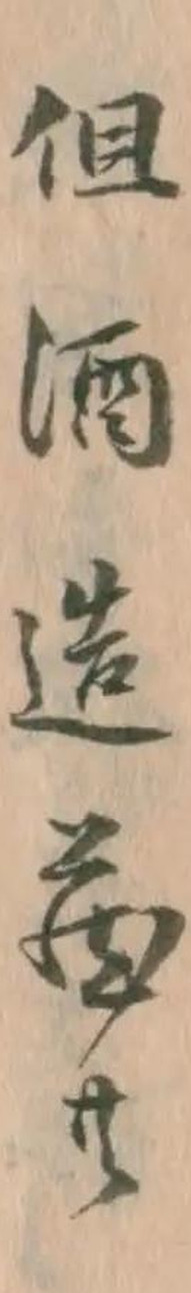但酒造蔵共
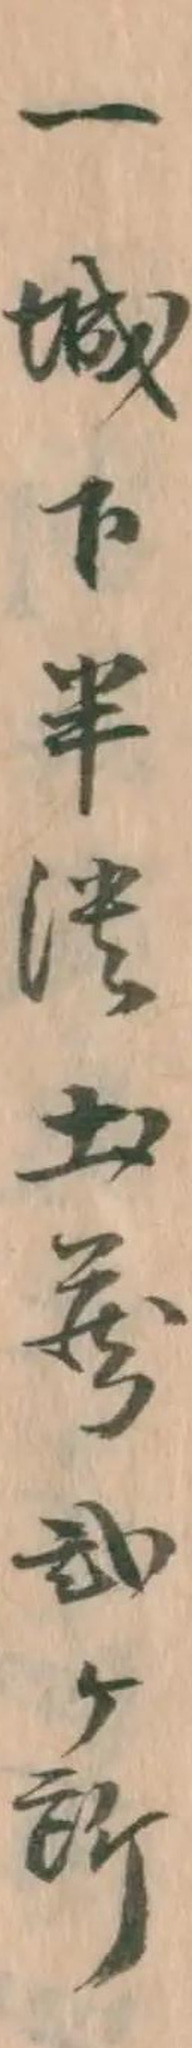一城下半潰土蔵弐ヶ所
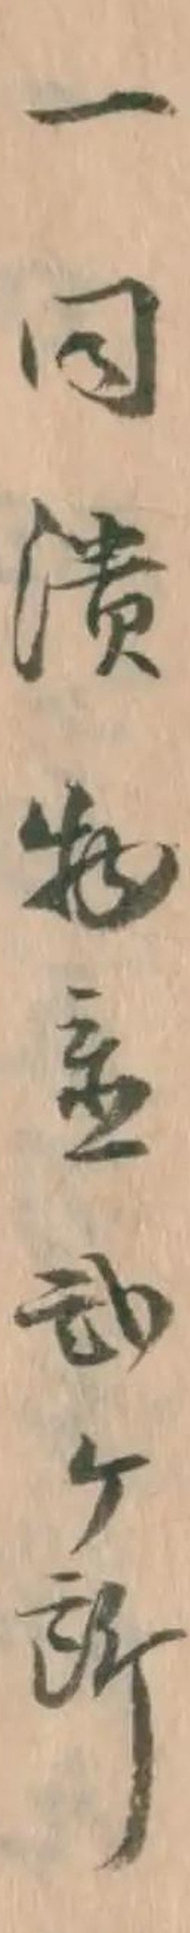一同潰物置弐ヶ所

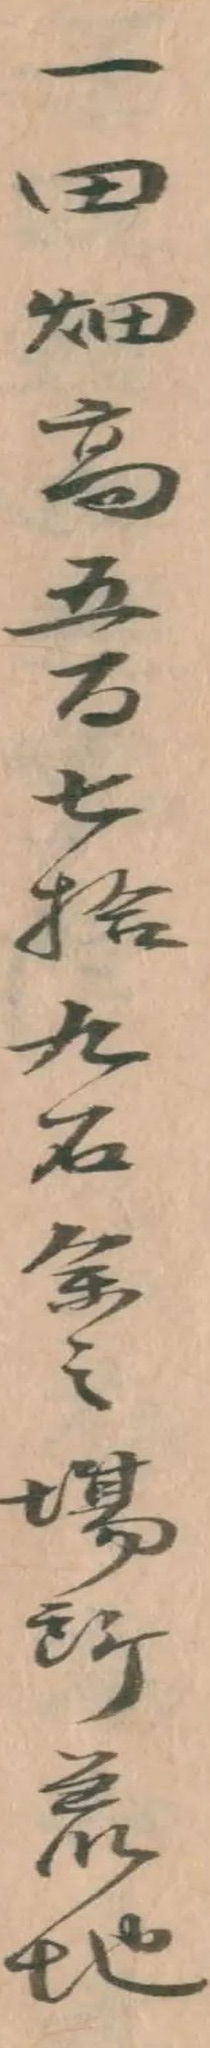一田畑高五百七拾九石余之場所荒地
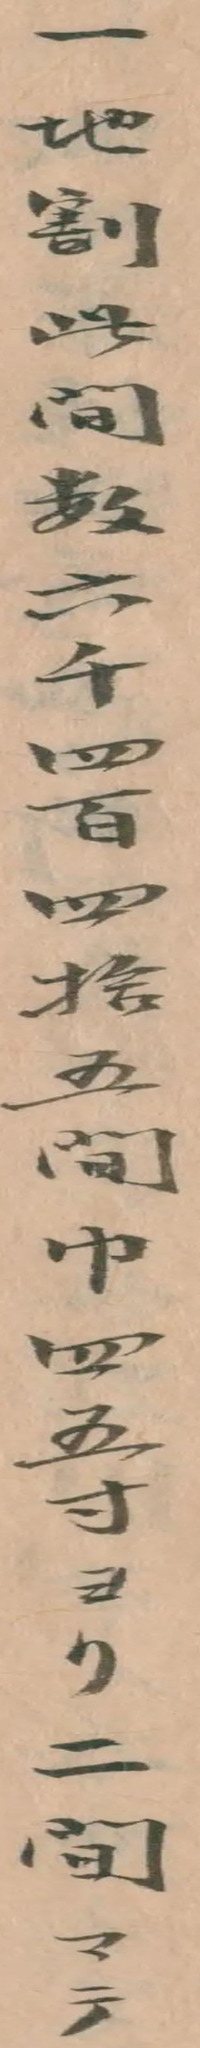一地割此間数六千四百四十五間巾四五寸ゟ二間迄
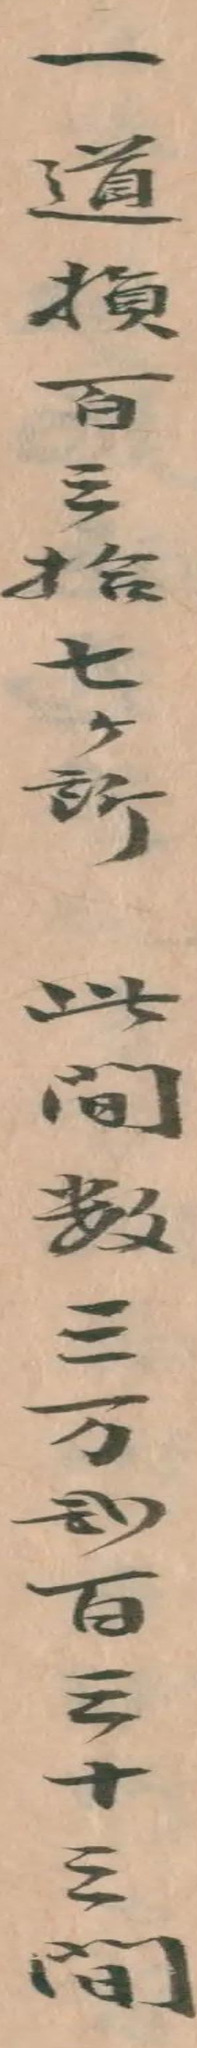一道損百三拾七ヶ所此間数三万弐百三十三間
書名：地災撮要. 巻3(地震之部)-巻4(噴火之部)
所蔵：国立国会図書館 National Diet Library, JAPAN
